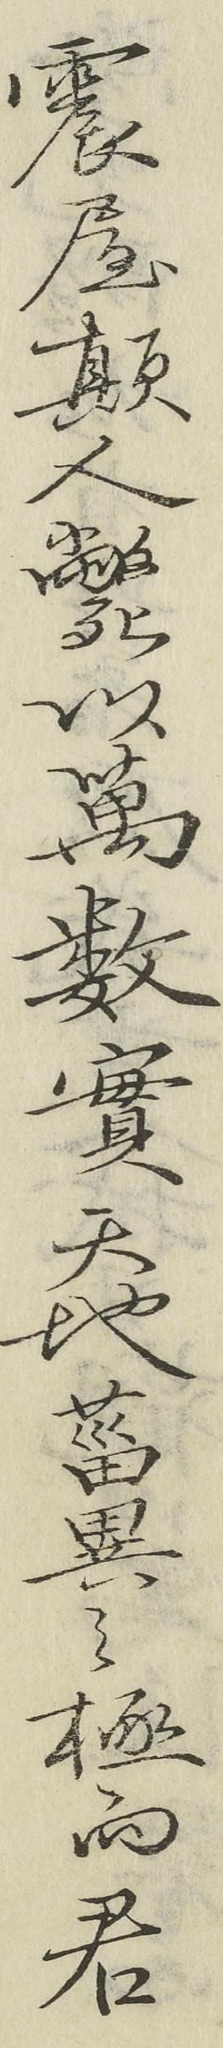震屋顚人斃以万数実天地菑異之極四君
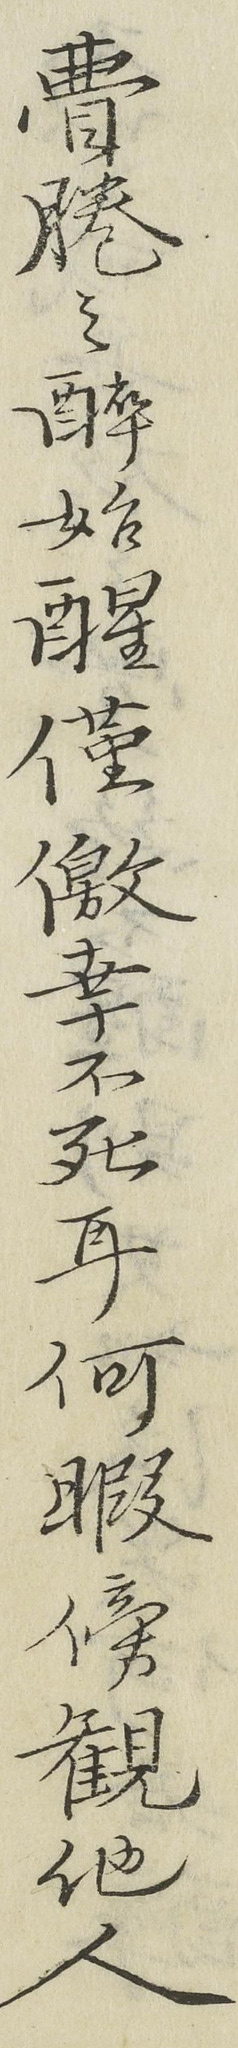勝之酔始醒僅儌幸不死耳何暇傍観他人
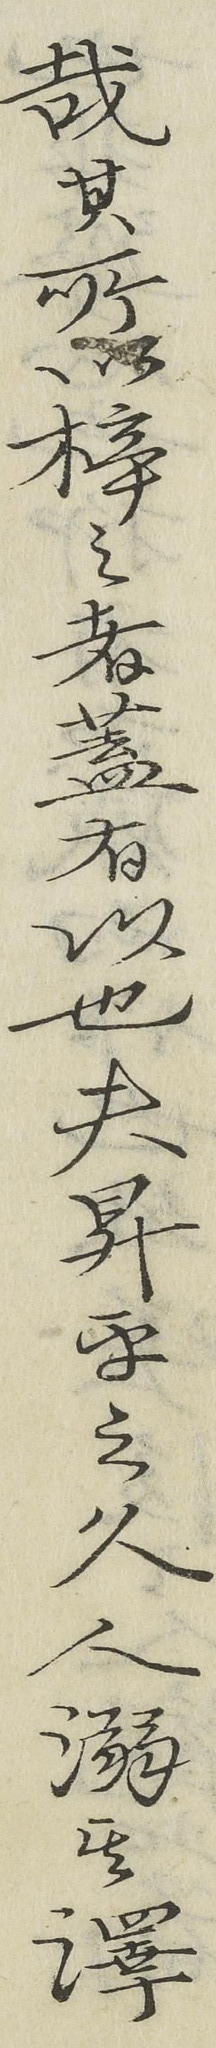哉其所以梓之者蓋有以也夫昇平之久人溺其沢
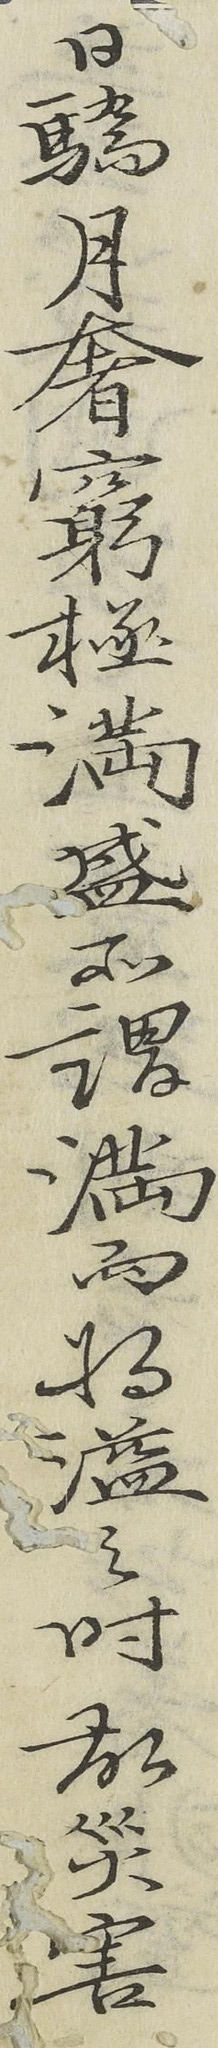日驕月奢窮極満盛所謂満而得溢之時故災害

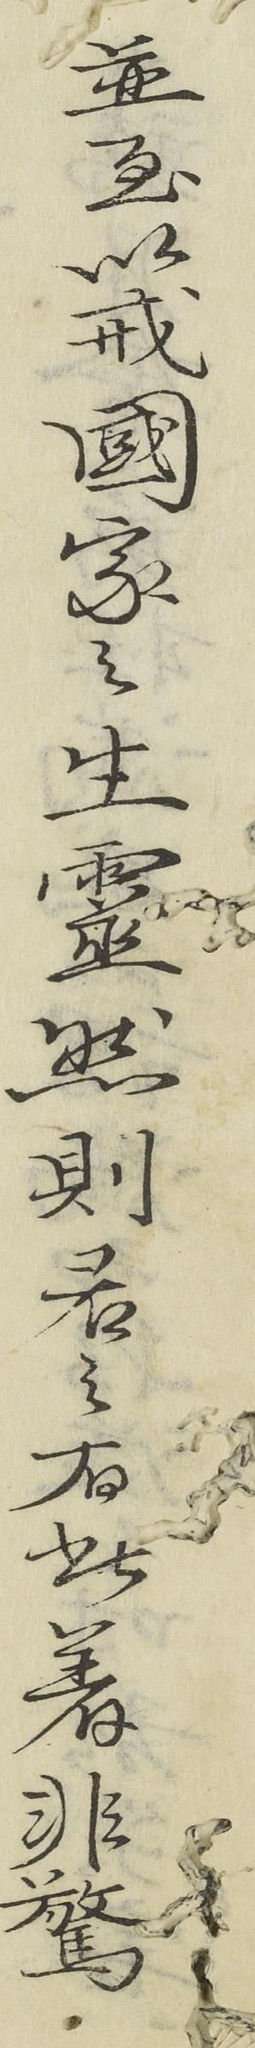並屋以戒國家之生霊然則君之有此着非驚
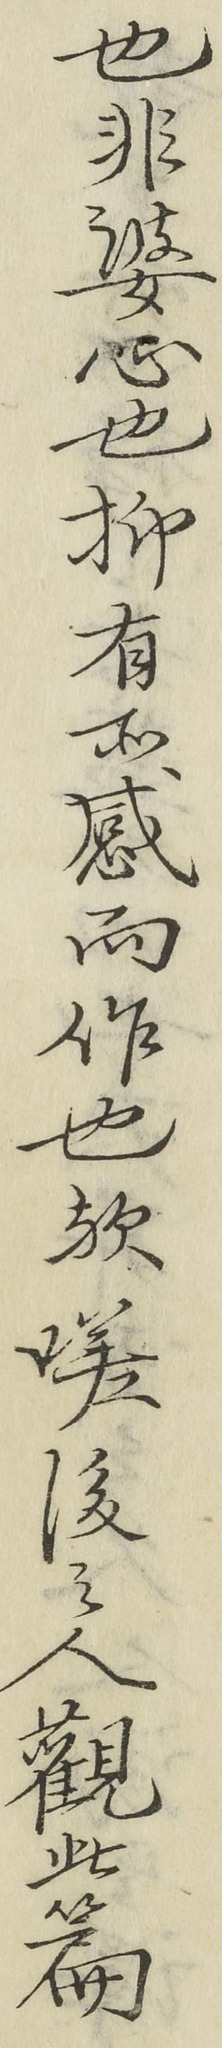也非婆心也抑有所感而作也欠嗟後之人観之篇
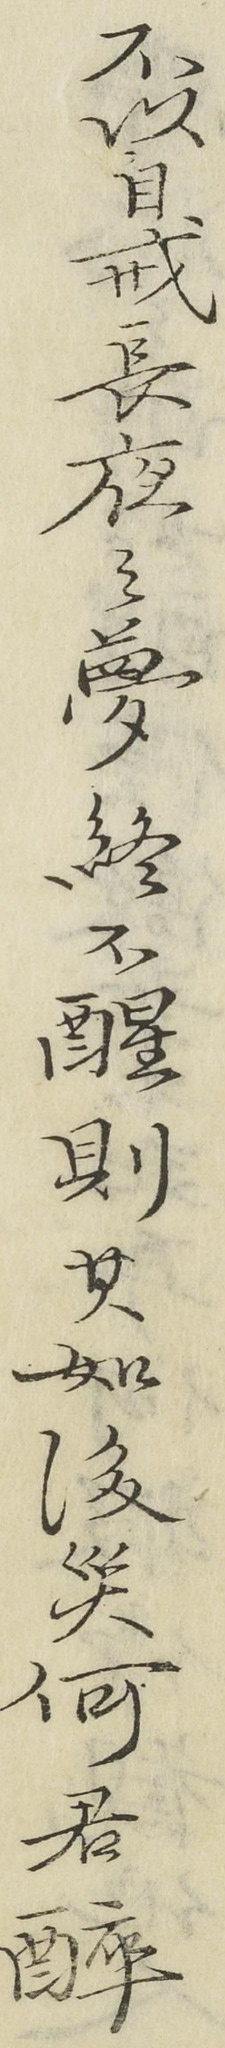不以自戒長夜之夢終不醒則其如後災何君醉
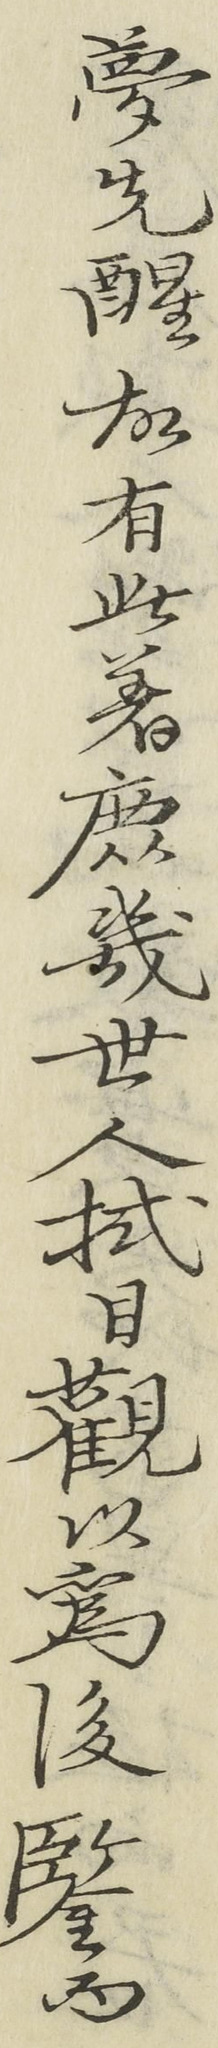夢先醒左有此着鹿幾世人拭目観以為後鍳而
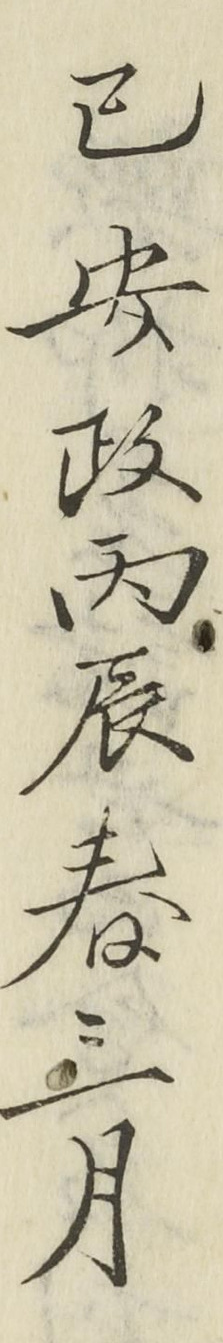已安政丙辰春三月
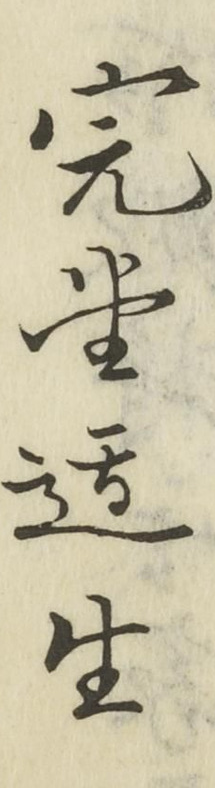完堂适生
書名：震雷考説　全
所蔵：東京大学地震研究所図書室 Earthquake Research Institute Library, The University of Tokyo, JAPAN
